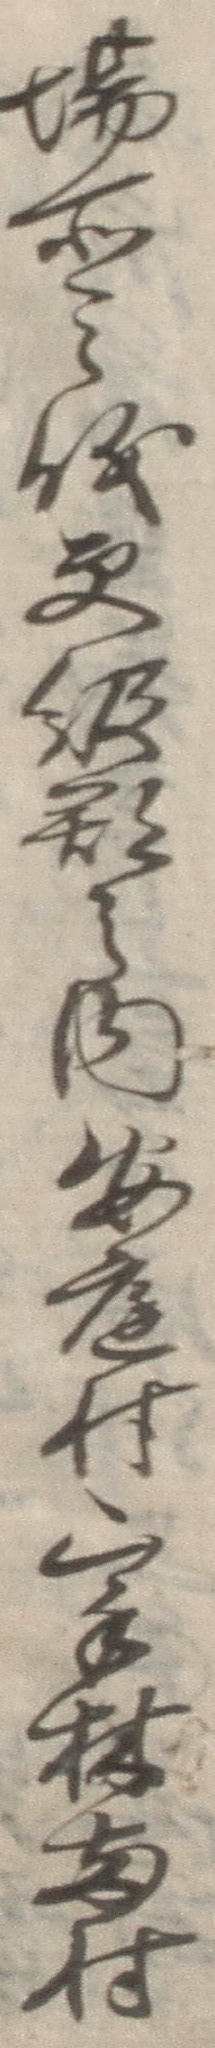場所の儀更級郡之内安庭村山平林両村
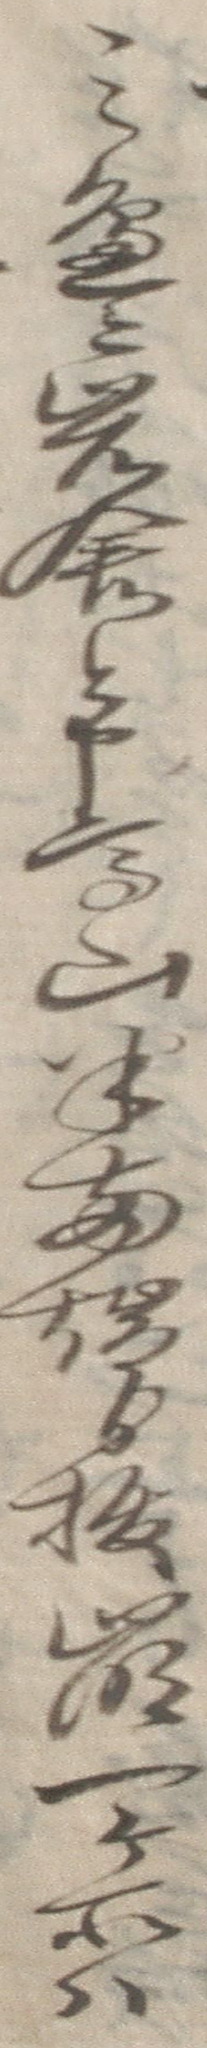之辺と岩倉と申高山半両端ゟ抜崩一ヶ所ハ
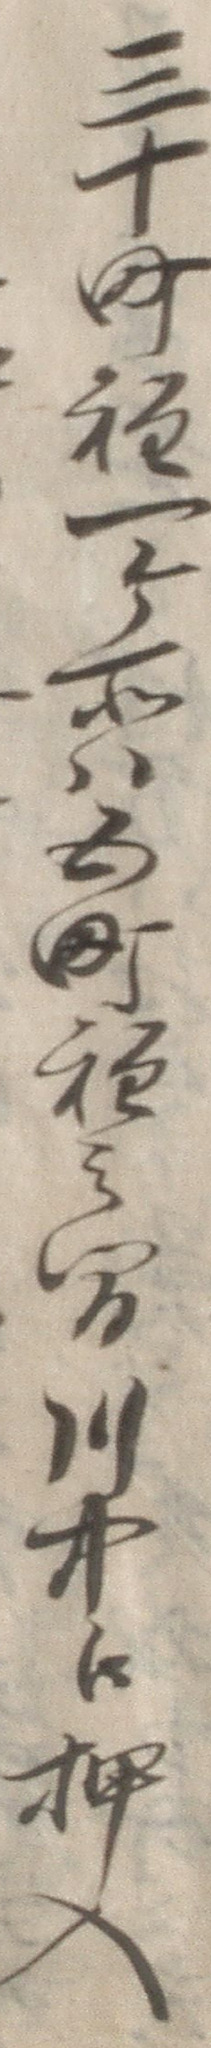三十町程一ヶ所ハ五町程之間川中江押入
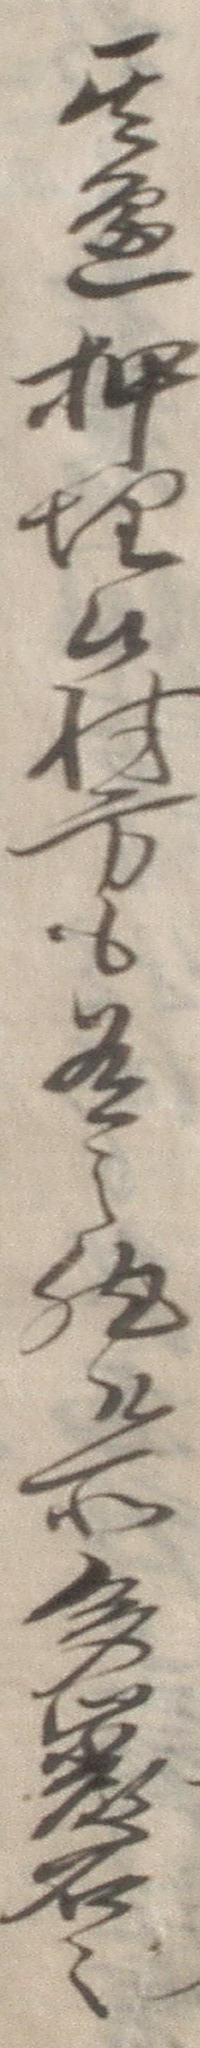其辺押埋候村方も有之然ㇽ所多巌石之
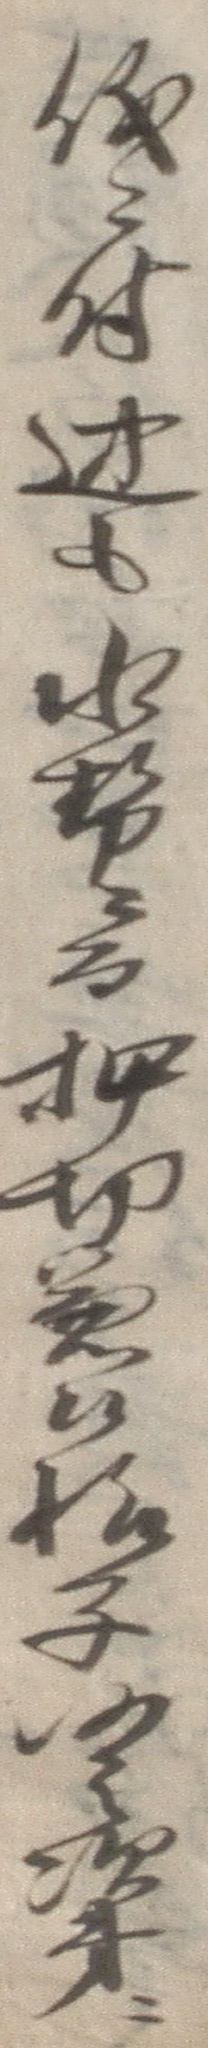儀二付迚も水勢二而押切兼候様子仍之次第二
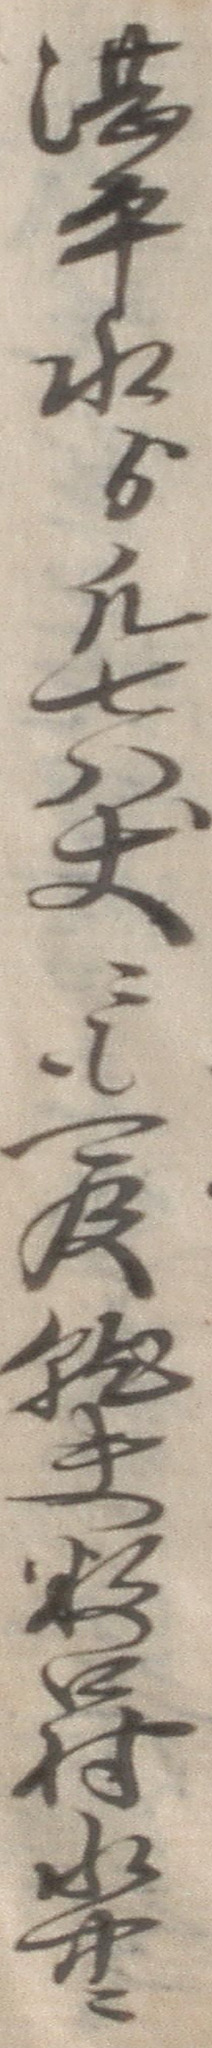湛平水ゟ凡七八丈二も可及就夫数口村水中二
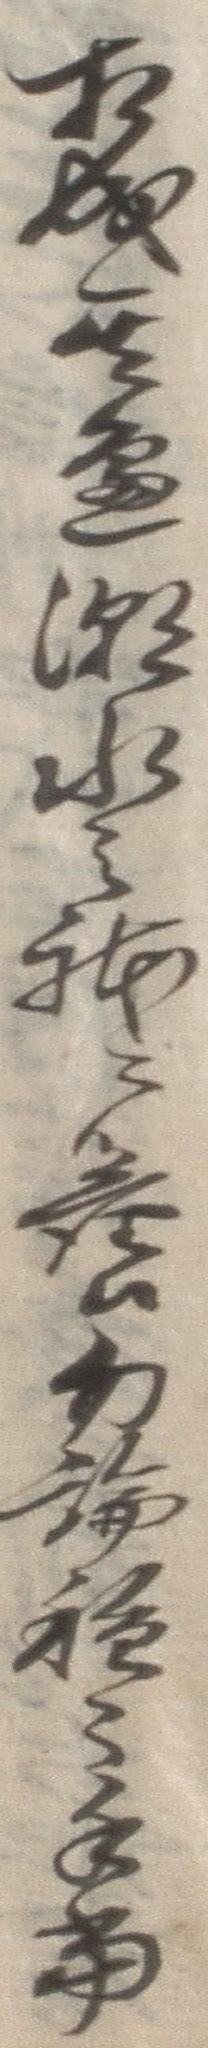相成其辺潮水之体二御座候勿論種々手当
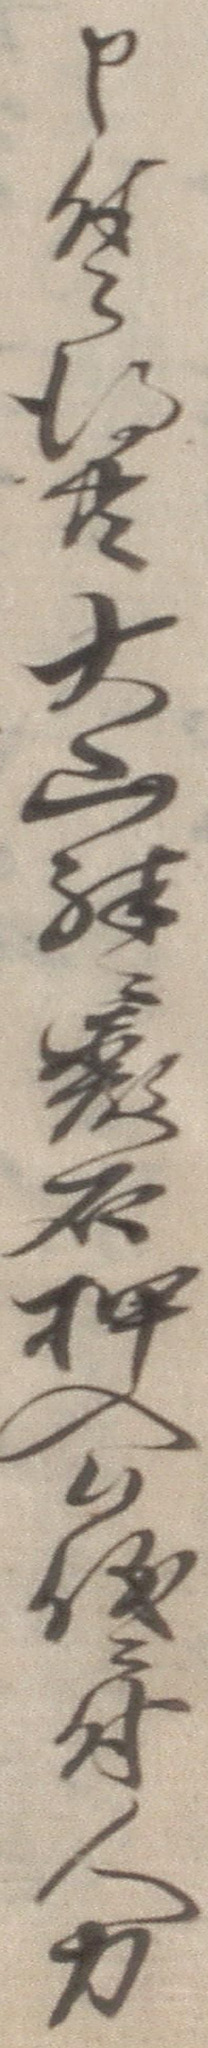申付候得共大山殊二巌石押入候儀二付人力
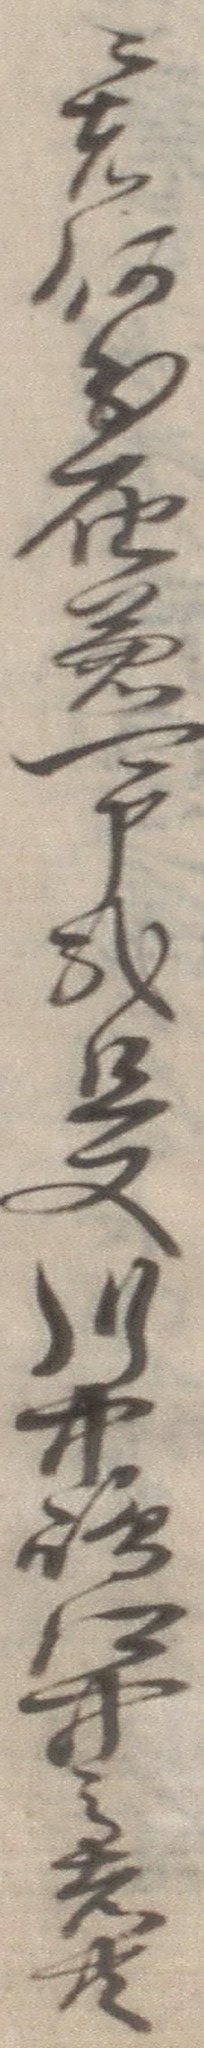二は何分届兼可申哉且又川中嶋郷中之者共
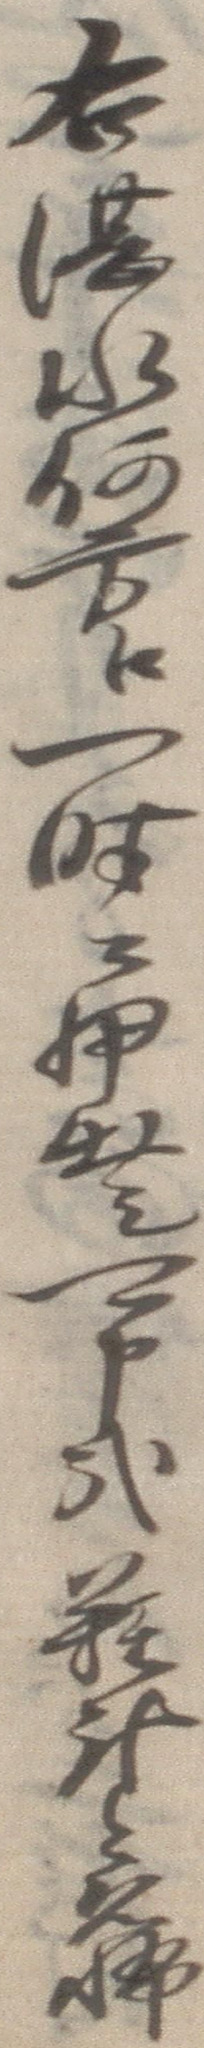右湛水何方江一時二押出ㇱ可申哉難計と恐怖
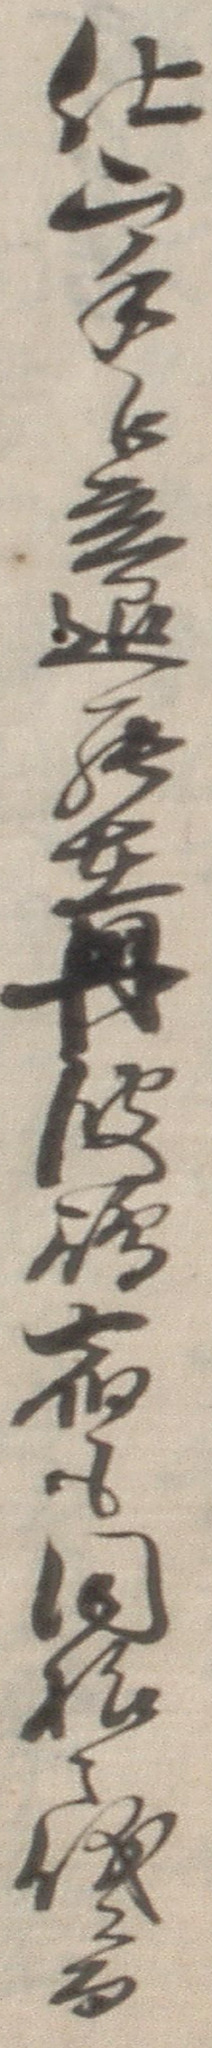仕山手江立退罷在丹波嶋宿も同様之儀二而
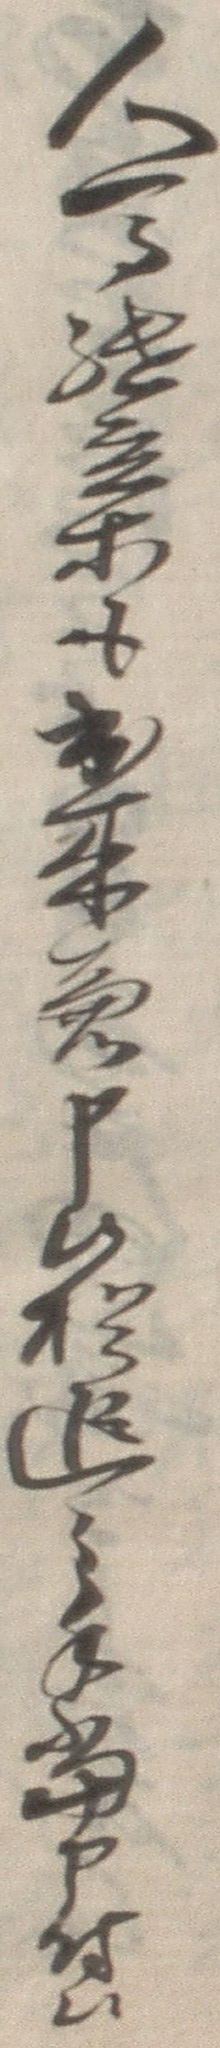人馬継立も出来兼申候程追々手当申付候
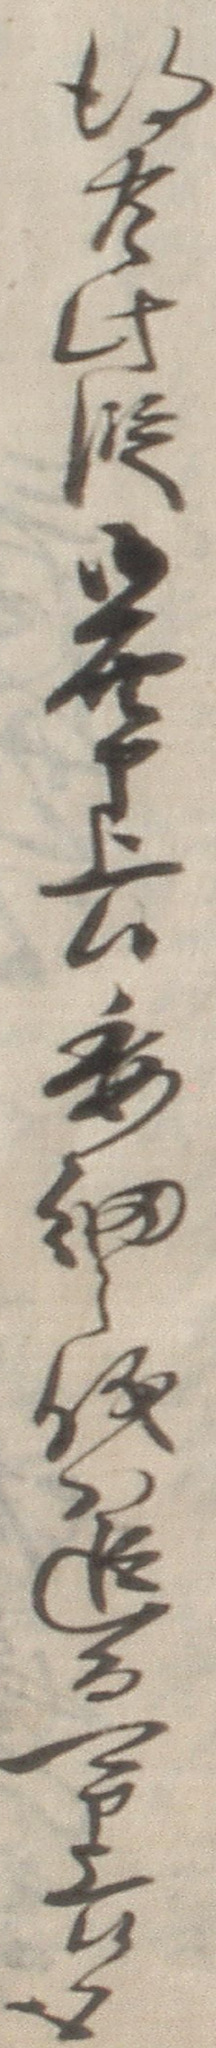得共此段御届申上候委細之儀ハ追而可申上候以上
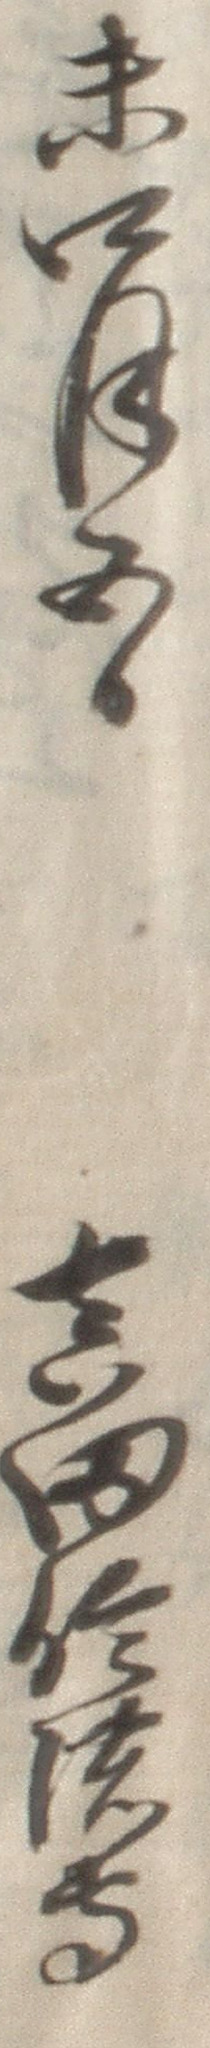未四月五日真田信濃守
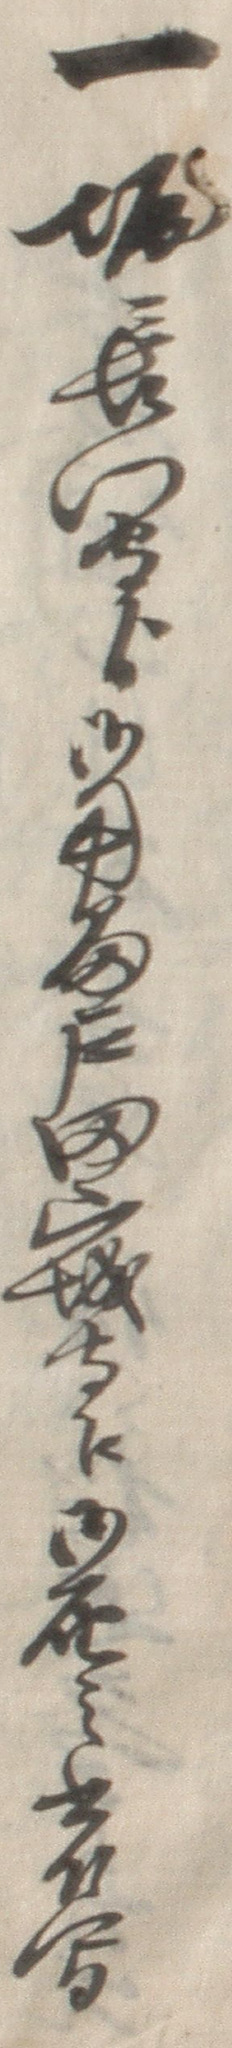一堀長門守ゟ御用番戸田山城守江御届之書付写
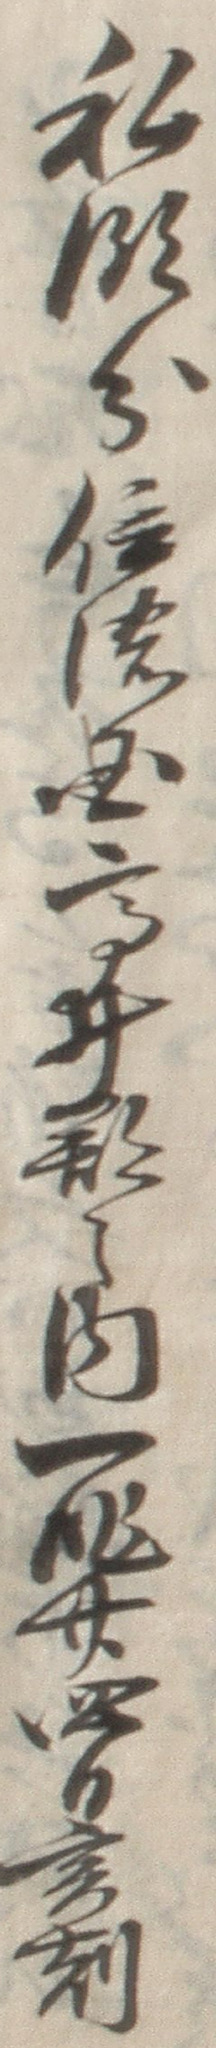私領分信濃国高井郡之内一昨廿四日亥刻
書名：信州地震一件
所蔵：東京大学地震研究所図書室 Earthquake Research Institute Library, The University of Tokyo, JAPAN
